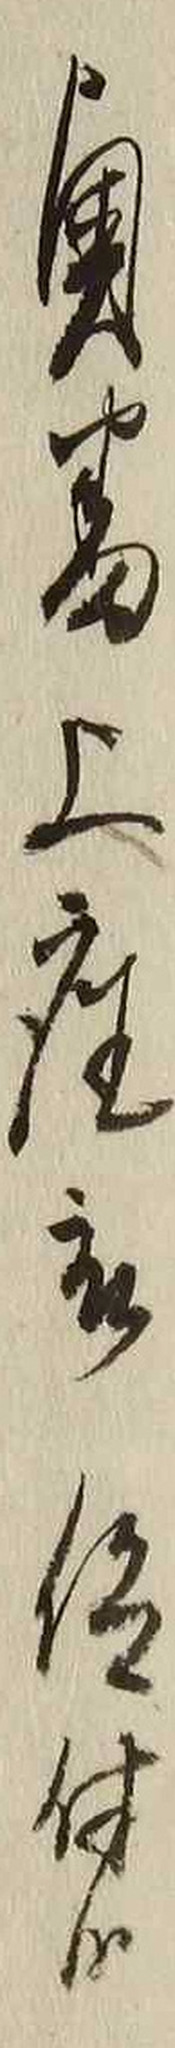奥番上座被仰付候
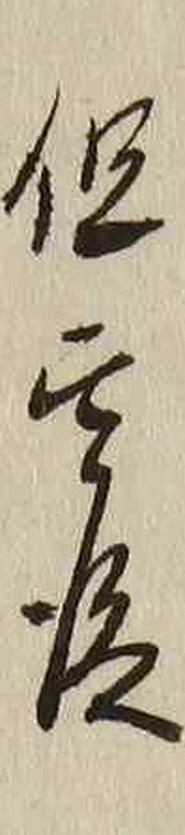但其後
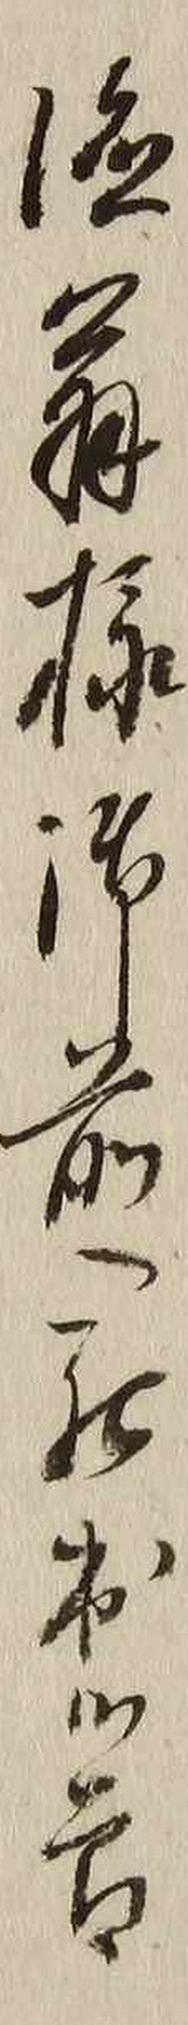徳翁様御前へ罷出候節
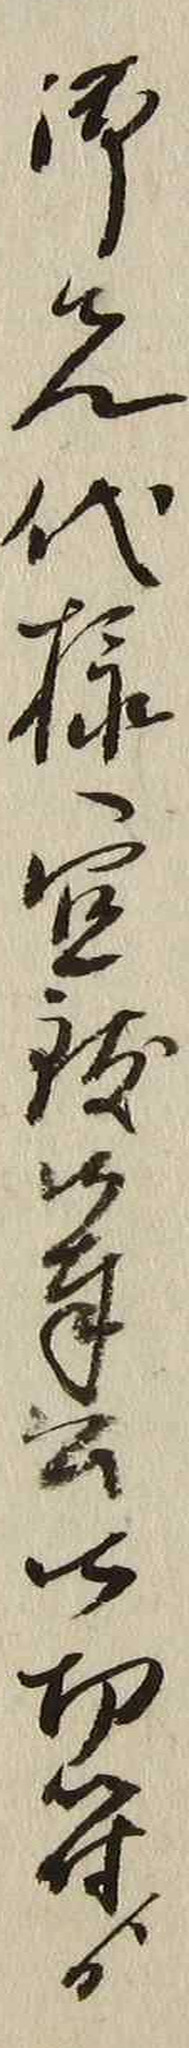御先代様へ宜致御奉公御切符ゟ
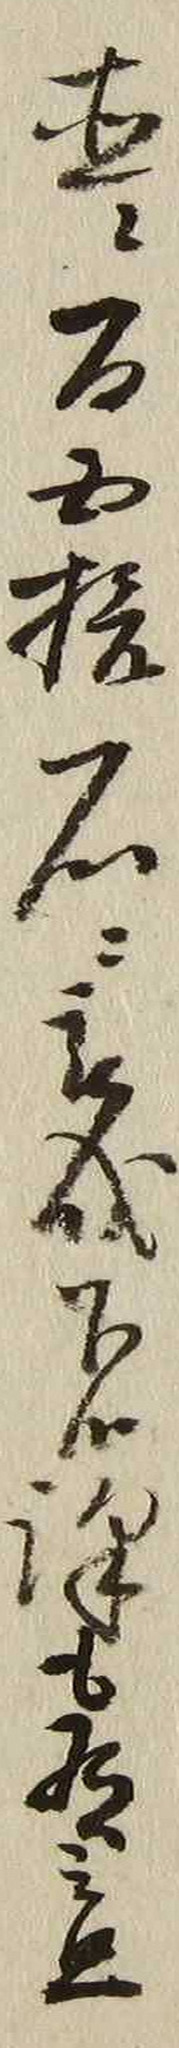直ニ百五拾石ニ被成下候訳も有之且
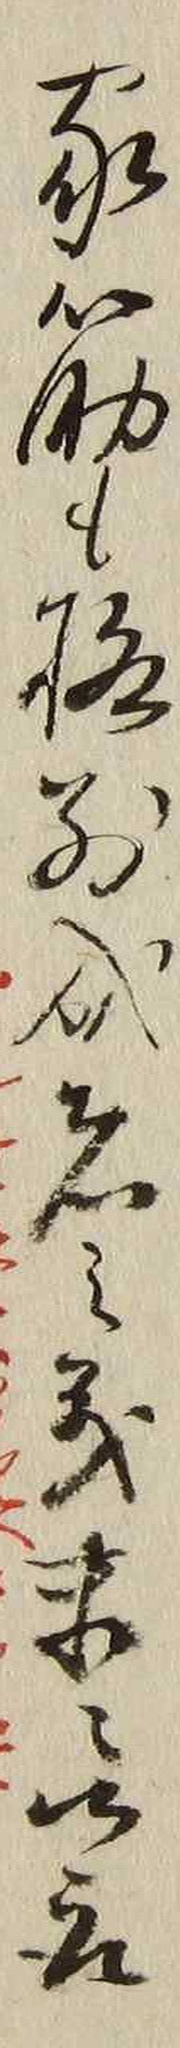家筋も格別成者之義末々御取
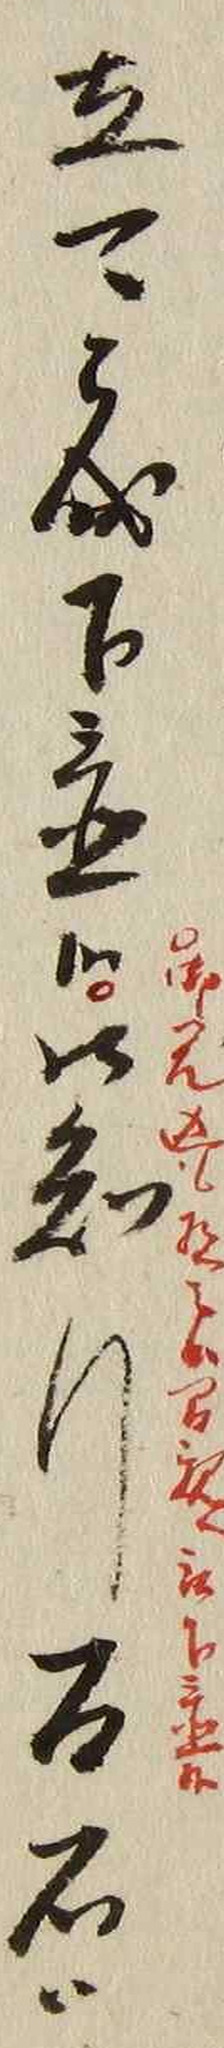立可被成下置候◦御知行百石ハ
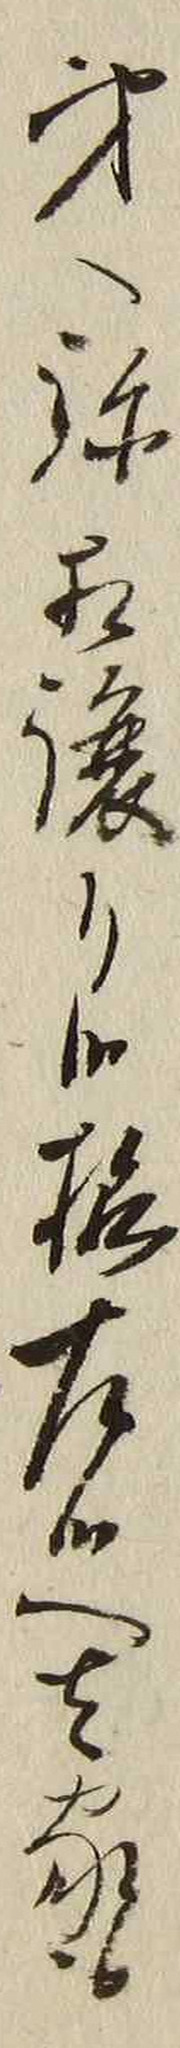弟へ弥相譲り候様左候へ者家も
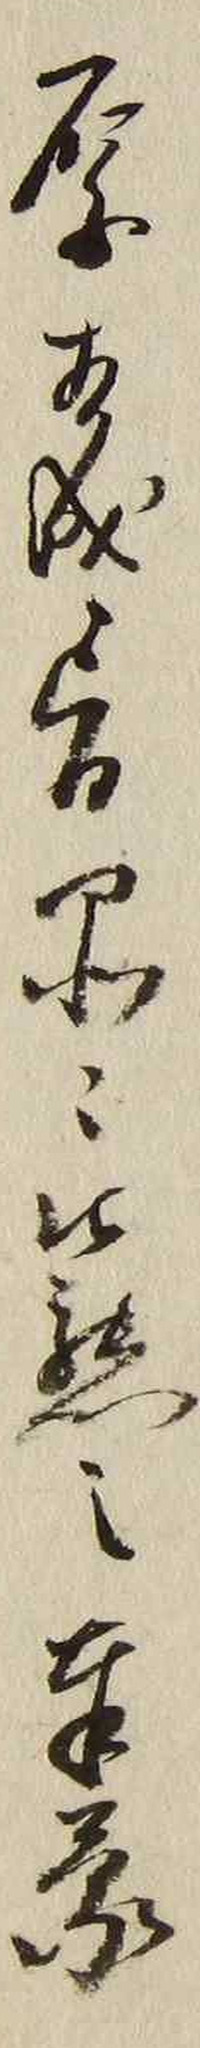厚相成候旨品々御懇之奉蒙
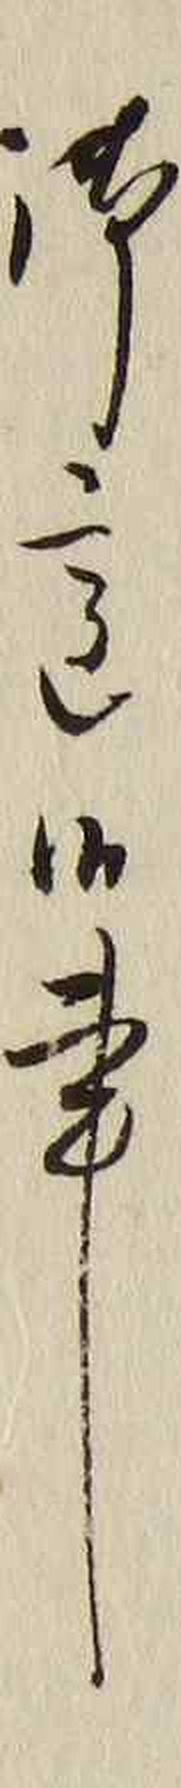御意候事

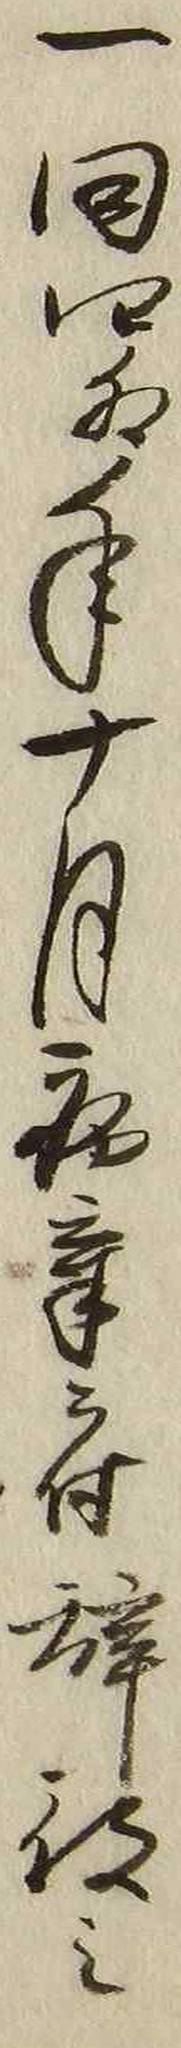一同四卯年十月病気ニ付辞役之
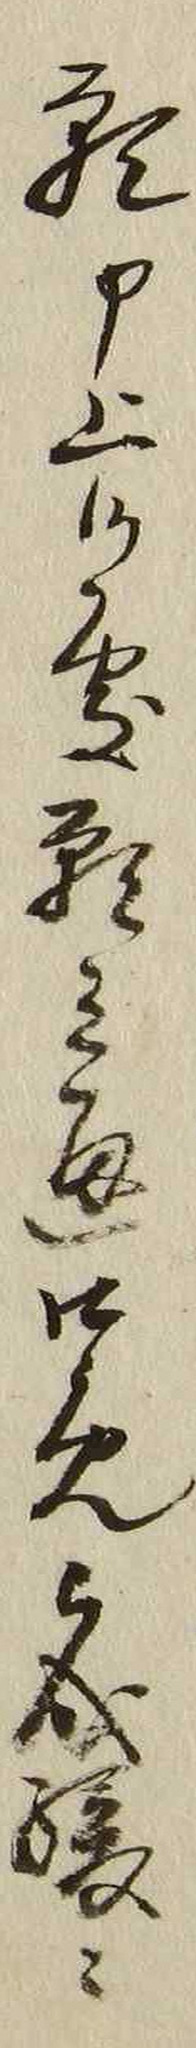願申上候処願之通御免被成緩々
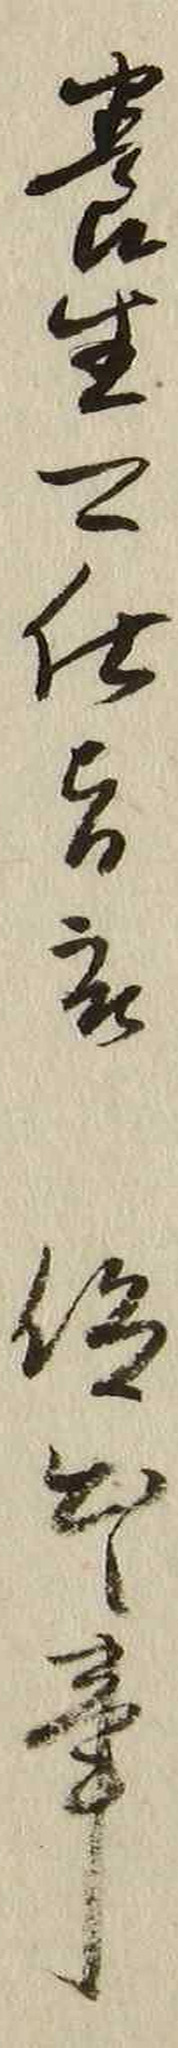養生可仕旨被仰出候事
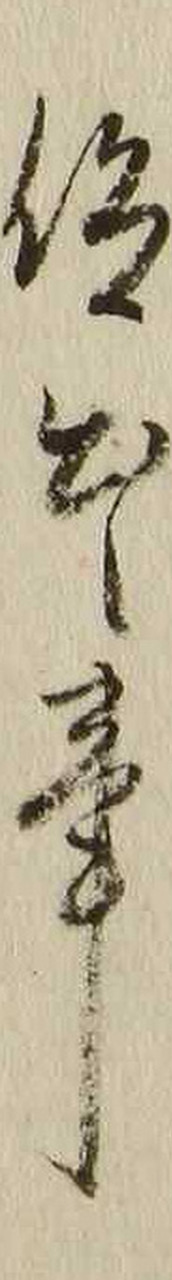仰付候事
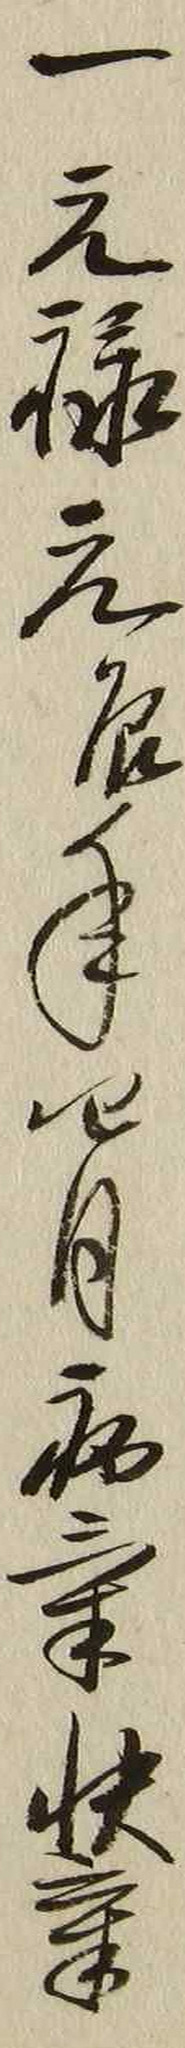一元禄元辰年四月病気快気
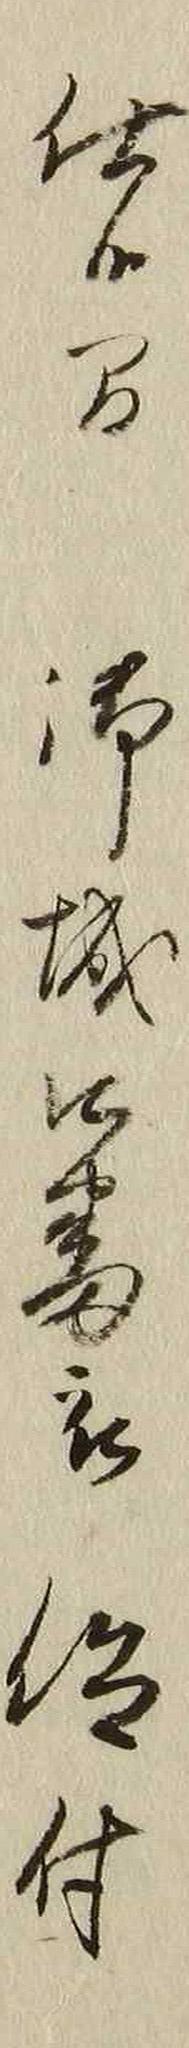仕候間御城御番被仰付
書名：諸士系譜　巻之351　す之部1
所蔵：会津若松市立会津図書館
